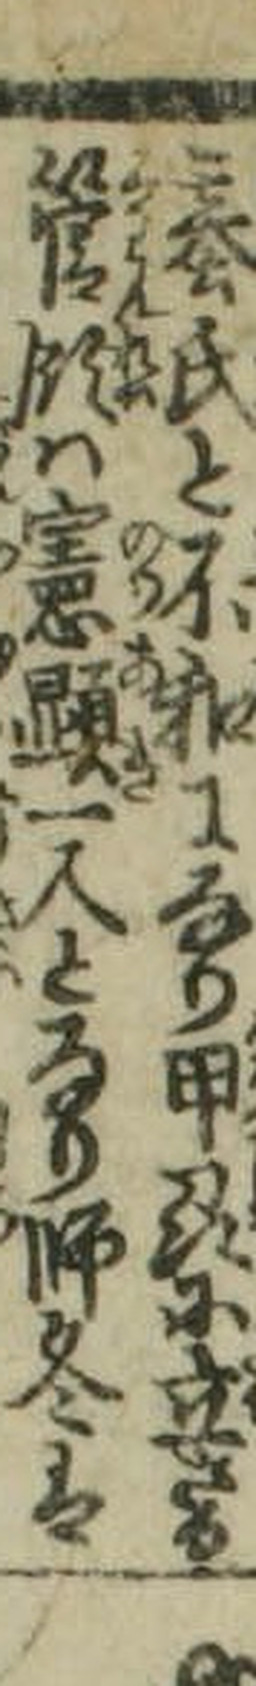管領は憲顕一人となり師冬は
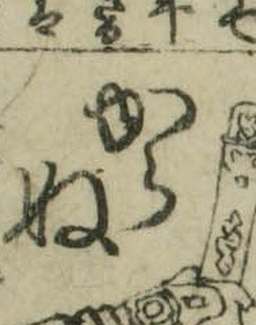からぬ
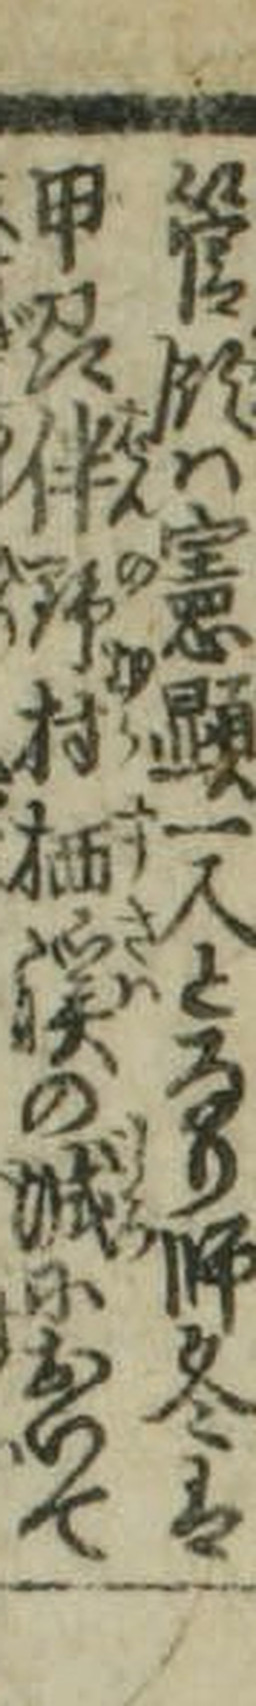甲州伴野村栖渓の城において
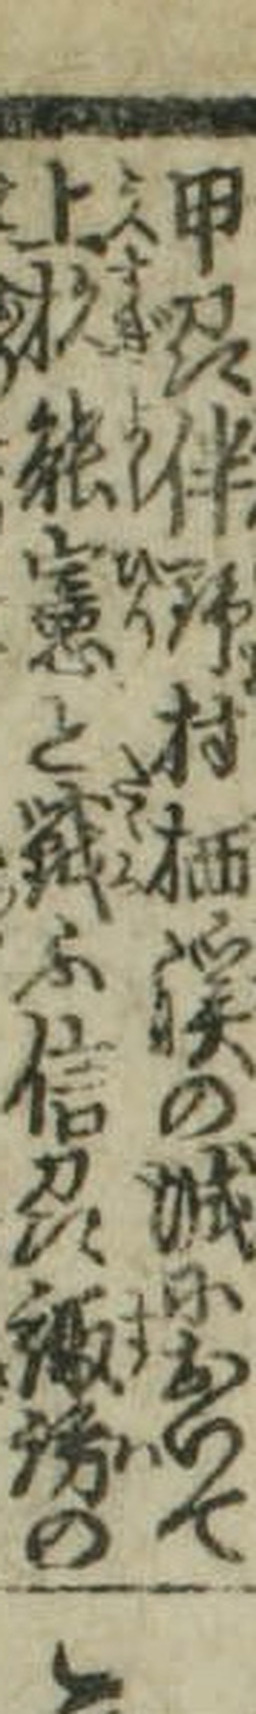上杉能憲と戦ふ信州諏訪の
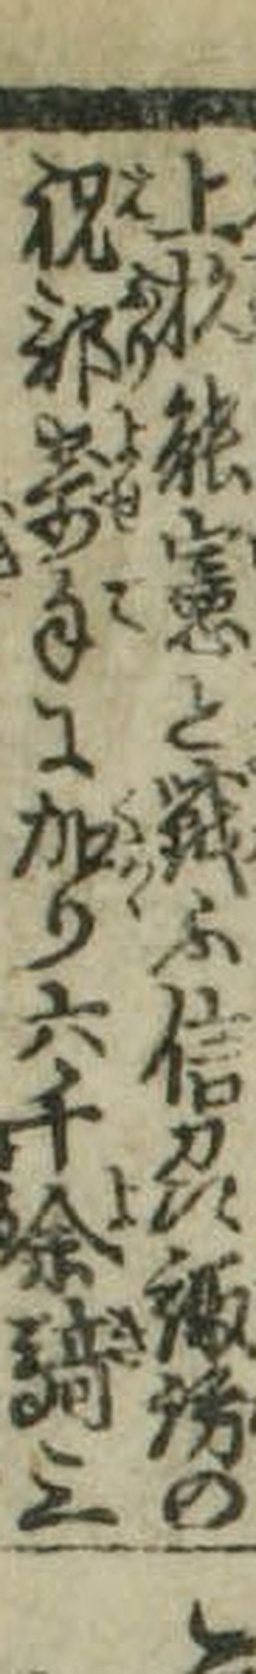祝部寄手に加り六千余騎三
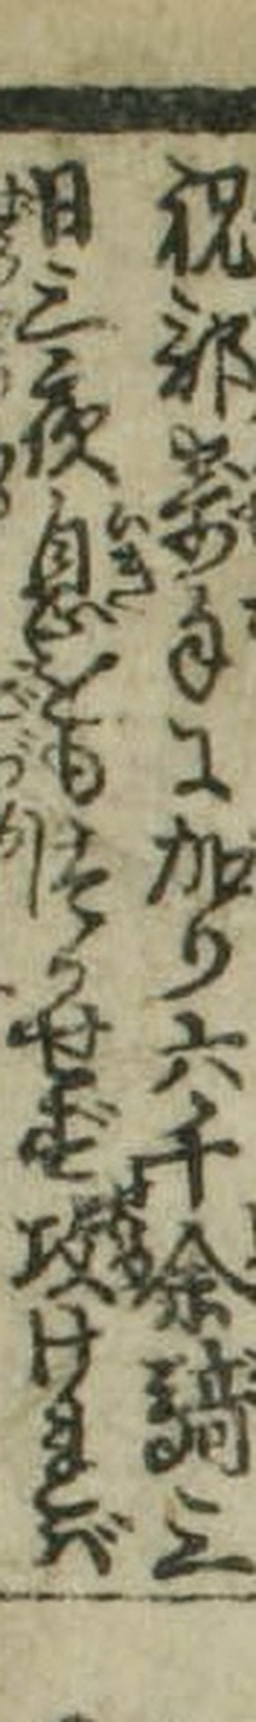日三夜息をもつかせず攻ければ
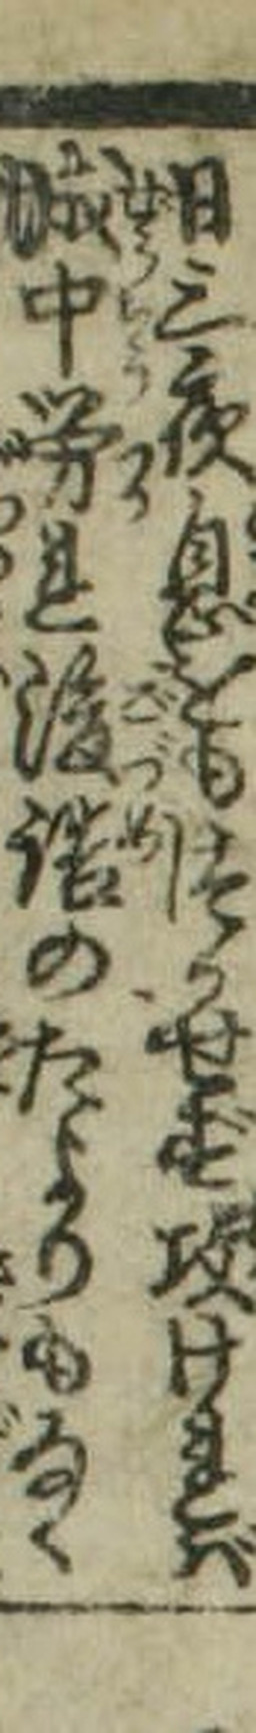城中労れ後詰のたよりもなく
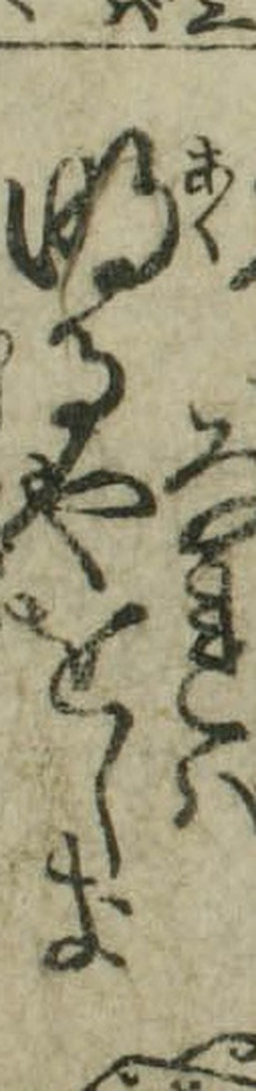明るやをしき
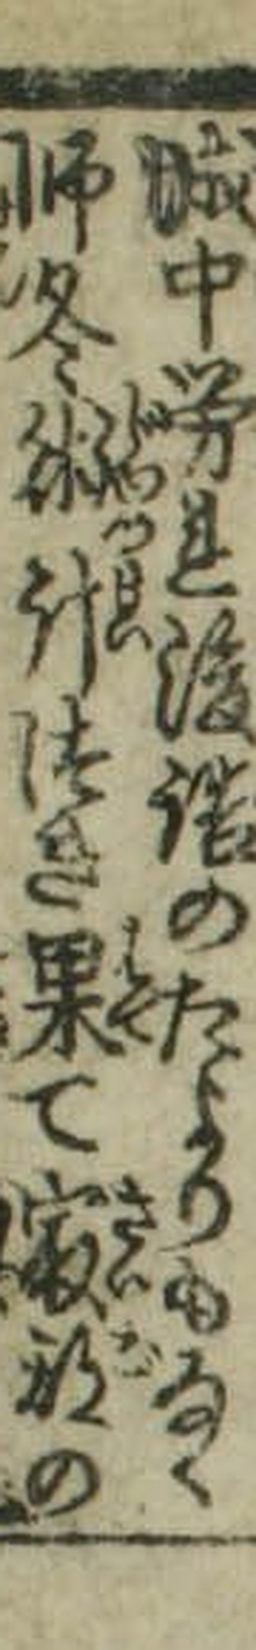師冬術計つき果て最期の
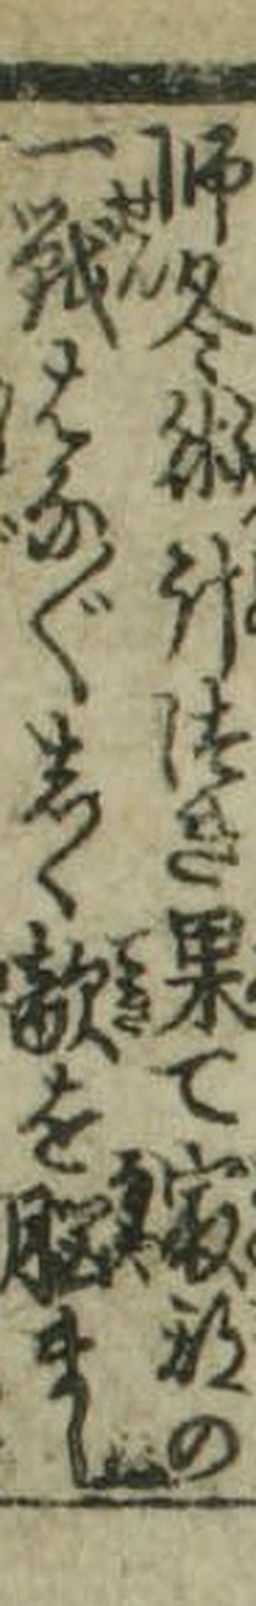一戦はな〴〵しく敵を悩まし
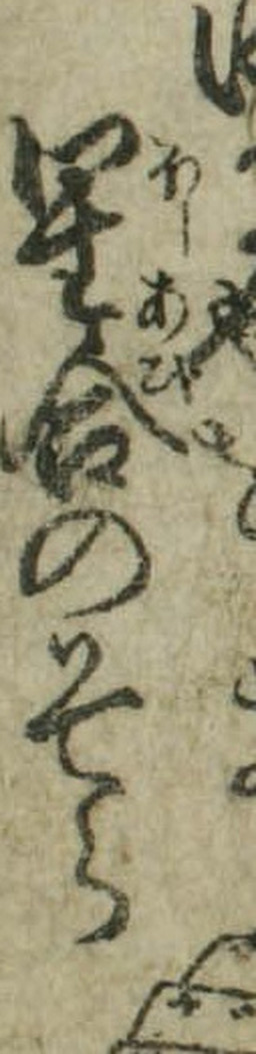星合のそら
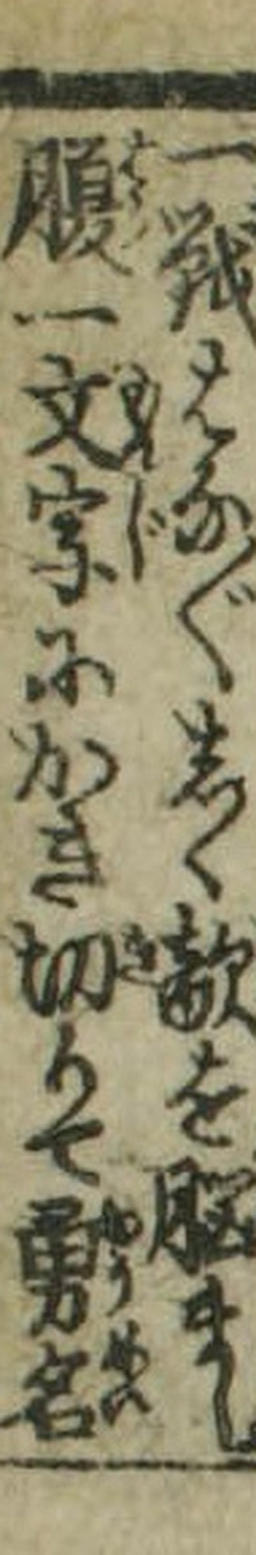腹一文字にかき切りて勇名
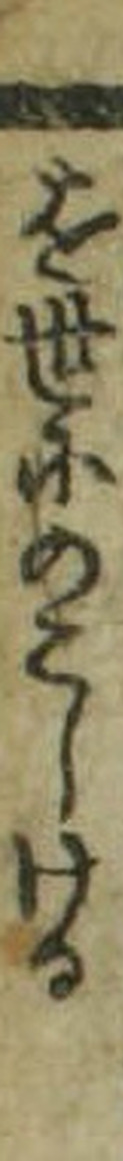を世にのこしける
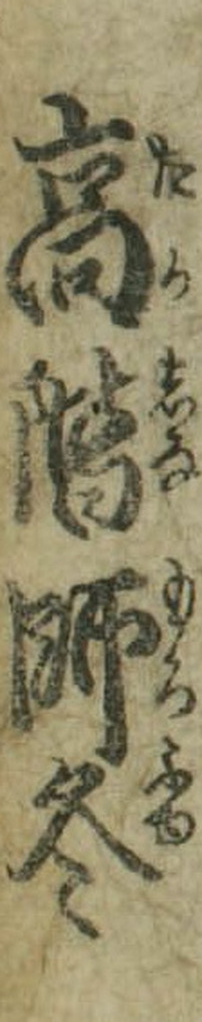高階師冬

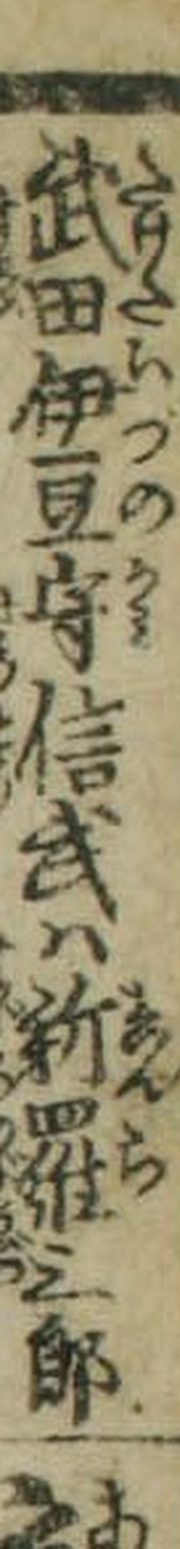武田伊豆守信武は新羅三郎
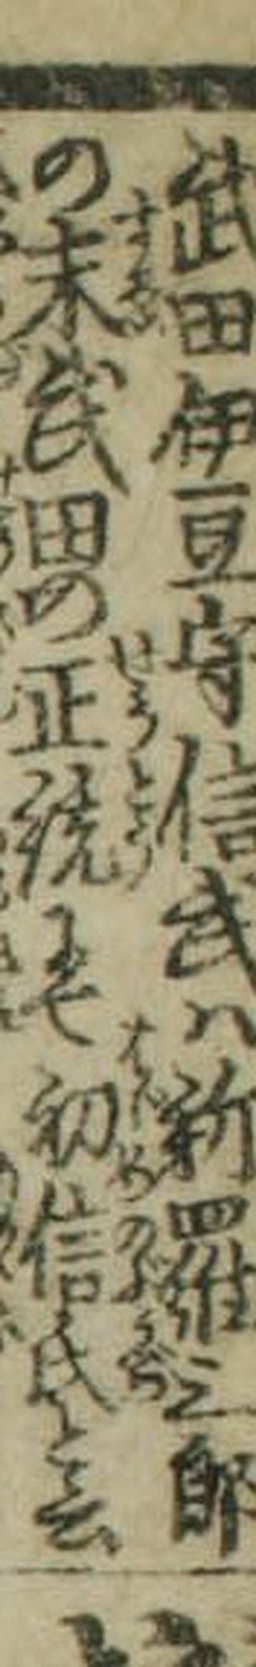の末武田の正統にて初信氏と言
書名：續英雄百人一首
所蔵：東京学芸大学附属図書館
